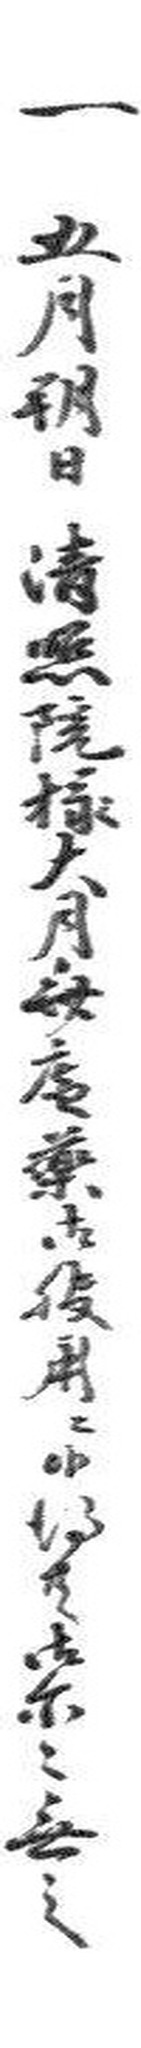一五月朔日清照院様大月斎庵薬御服用ニ候得共御尓々無之
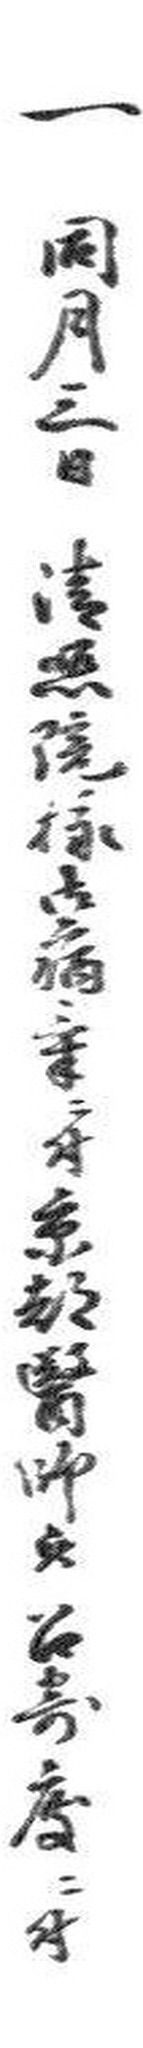一同月三日清照院様御病気ニ付京都医師被召寄度ニ付
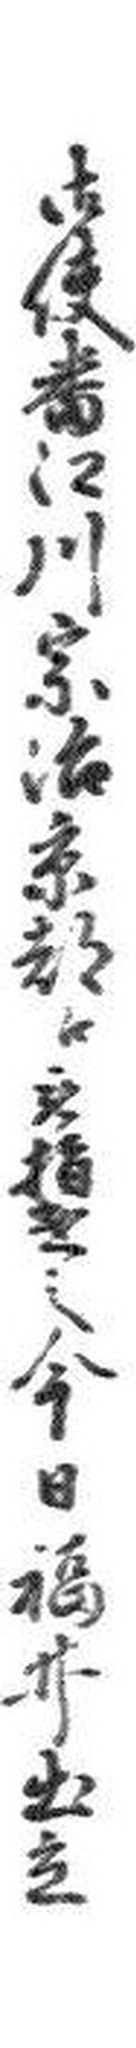御使番江川宗治京都江被指遣之今日福井出立

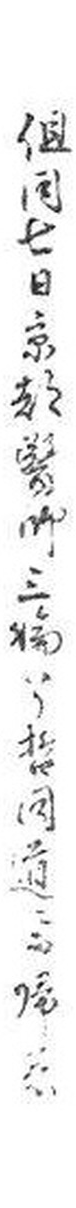但同七日京都医師三輪了哲同道ニ而帰着
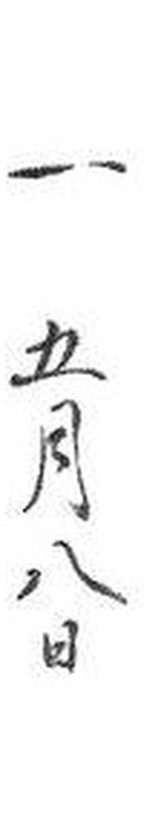一五月八日
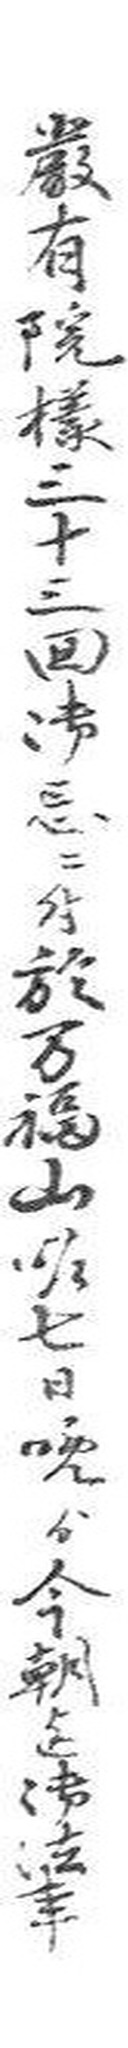厳有院様三十三回御忌ニ付於万福山昨七日晩ゟ今朝迄御法事
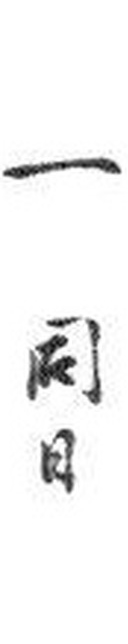一同日
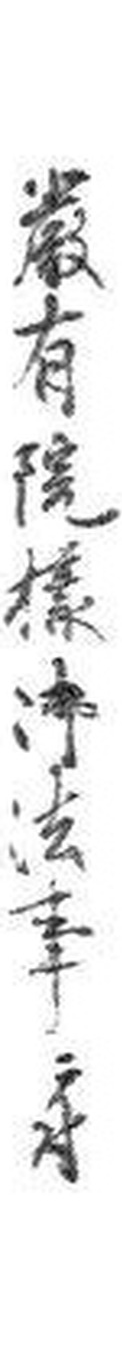厳有院様御法事ニ付
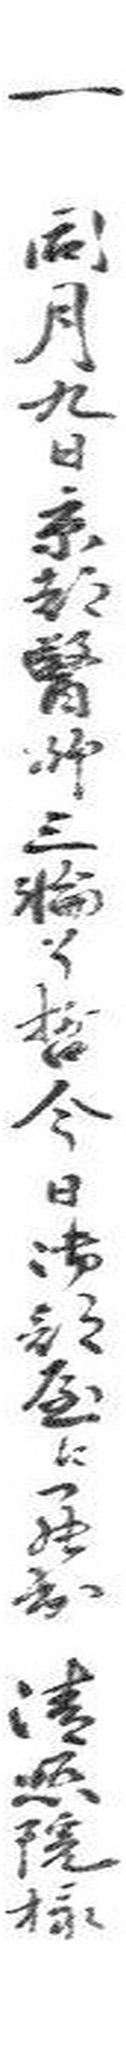一同月九日京都医師三輪了哲今日御部屋江罷出清照院様
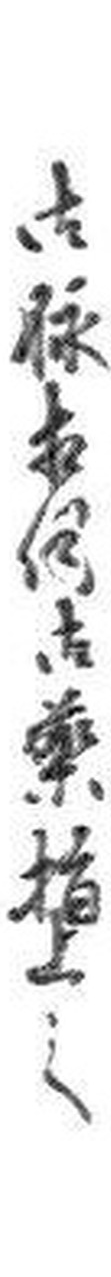御脈御伺御薬指上之
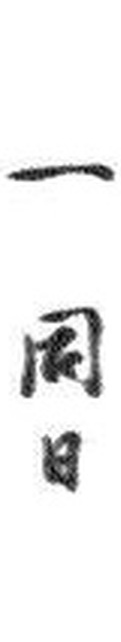一同日
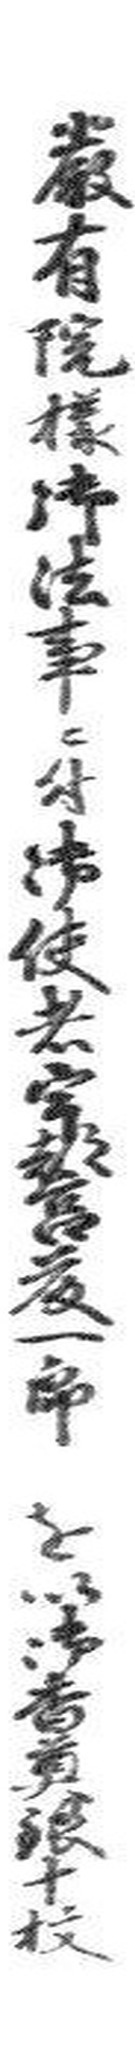厳有院様御法事ニ付御使者宇都宮藤一郎を以御香奠銀十枚
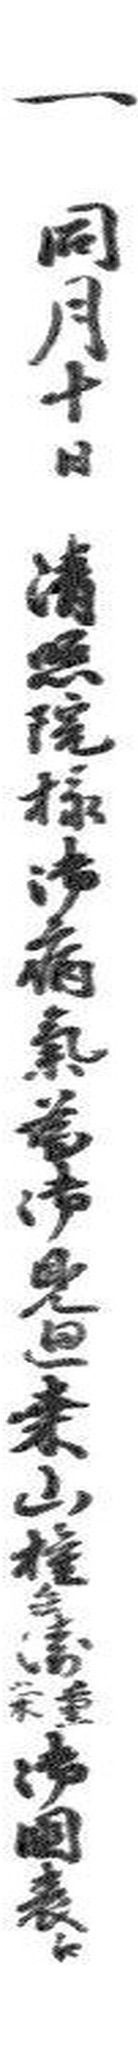一同月十日清照院様御病気御見廻桑山権兵衛重栄御国表江
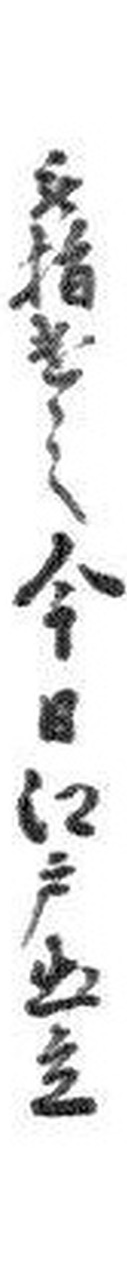被指遣之今日江戸出立
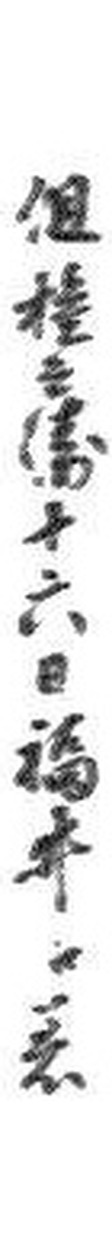但権兵衛十六日福井江着
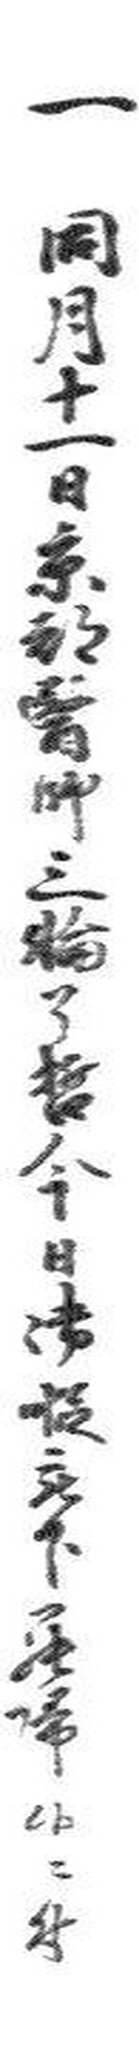一同月十一日京都医師三輪了哲今日御暇被下罷帰候ニ付
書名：家譜 二十九 吉邦公 従正徳二年到正徳三年
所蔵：福井県文書館 Fukui Prefectural Archives
